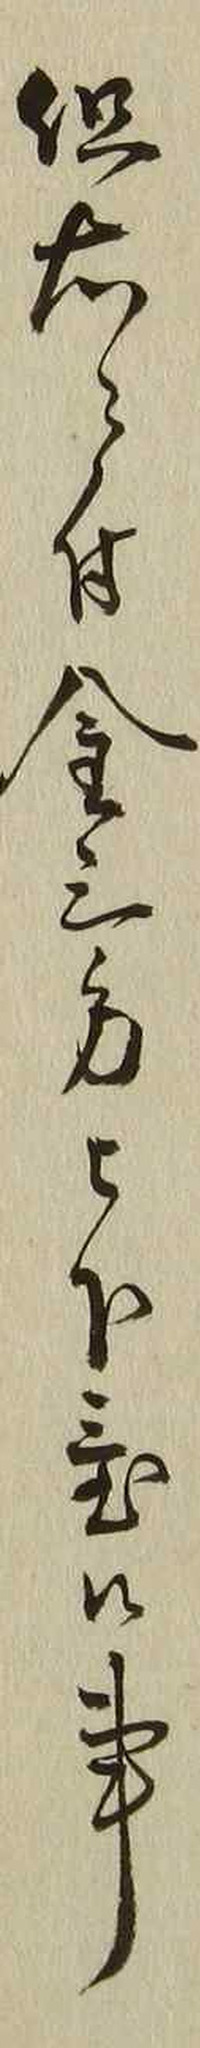但右ニ付金三分被下置候事
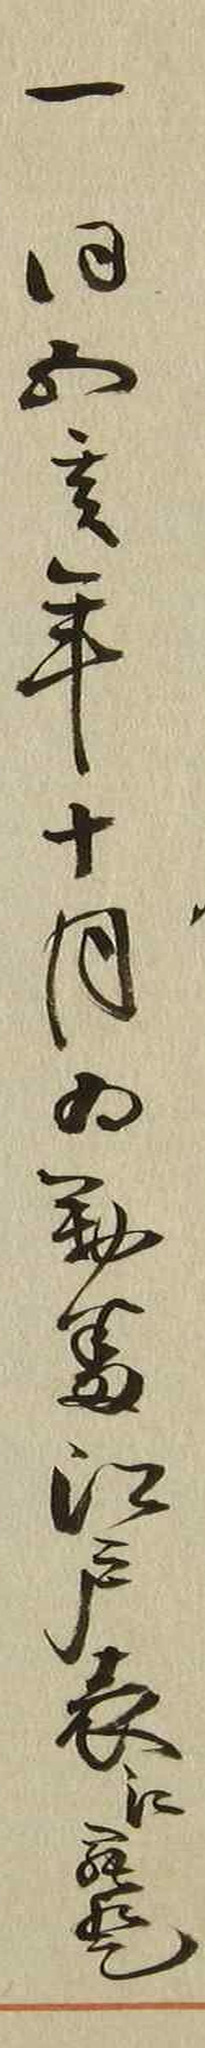一同五亥年十月為勤番江戸表江罷登
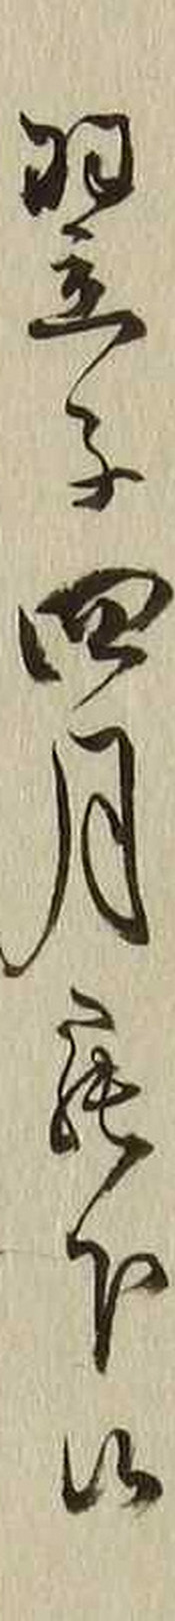翌子四月罷下候
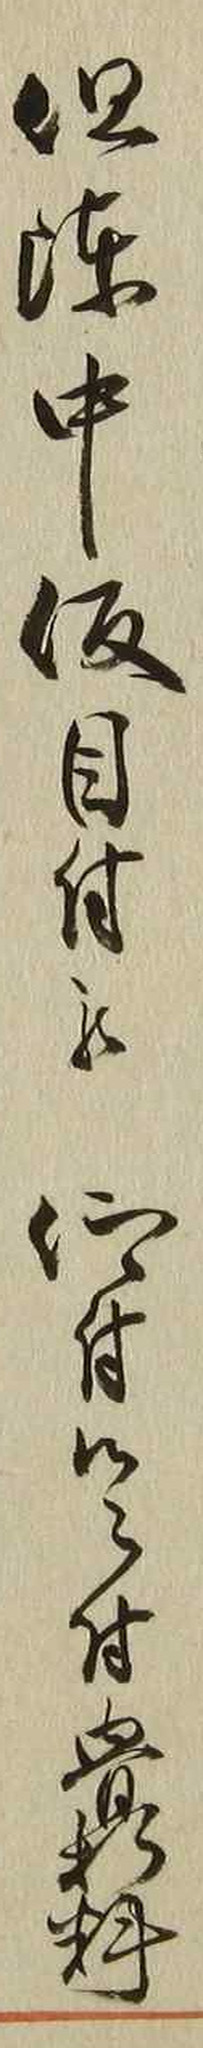但陣中仮目付被仰付候ニ付骨折料
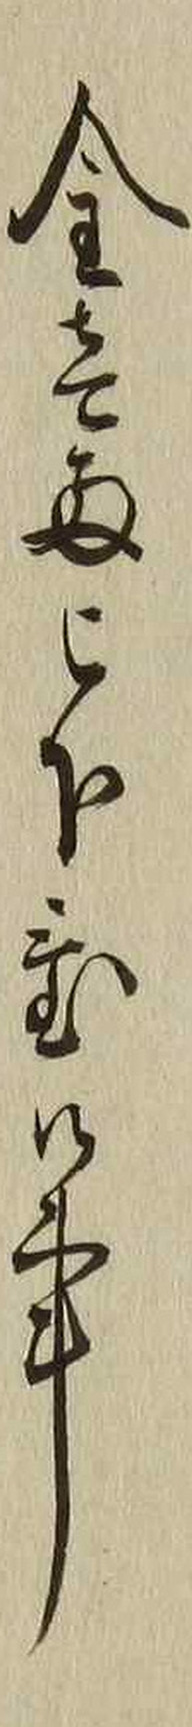金壱両被下置候事
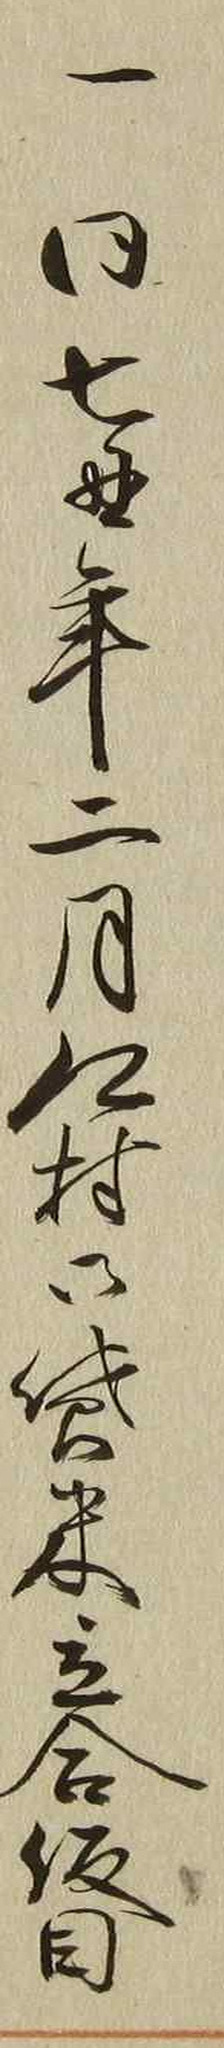一同七丑年二月郷村御貸米立合仮目
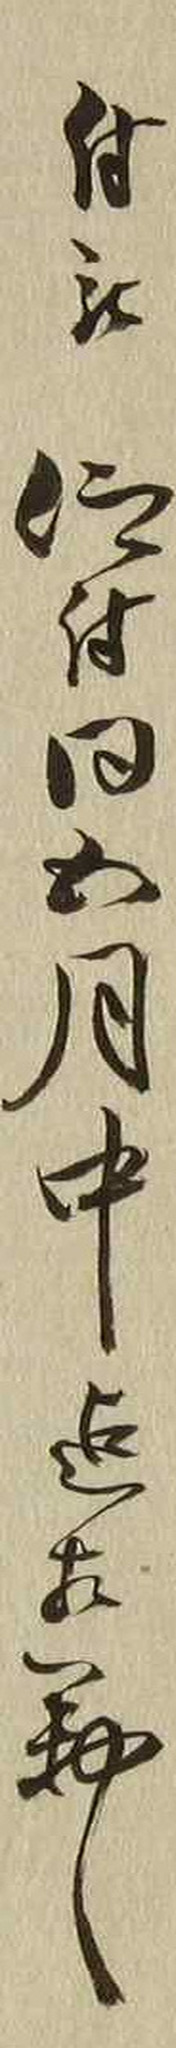付被仰付同五月中迄相勤候
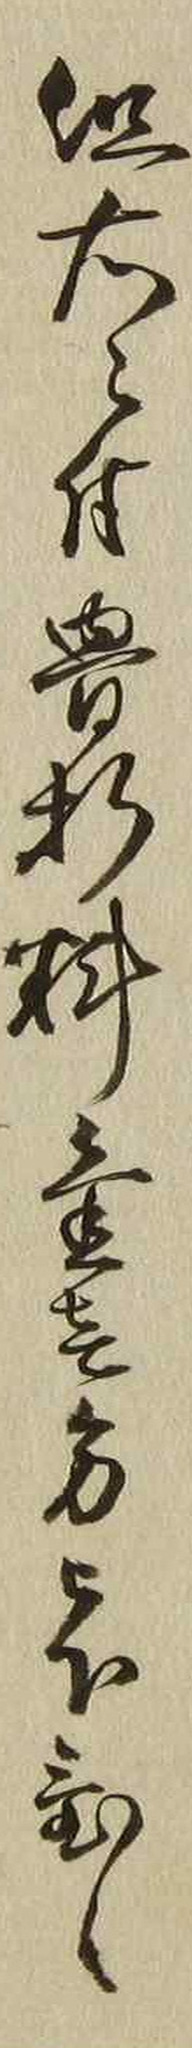但右ニ付骨折料金壱分被下置候
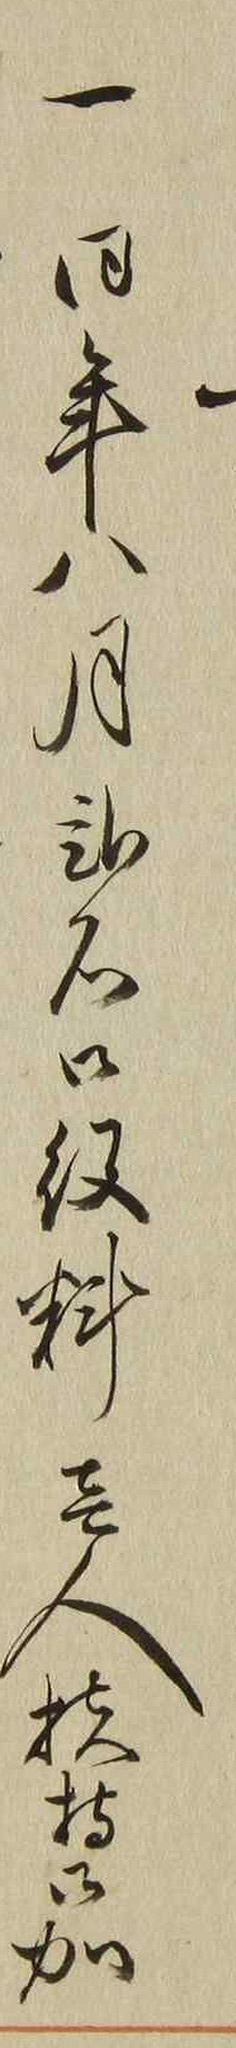一同年八月弐石御役料一壱人扶持御加
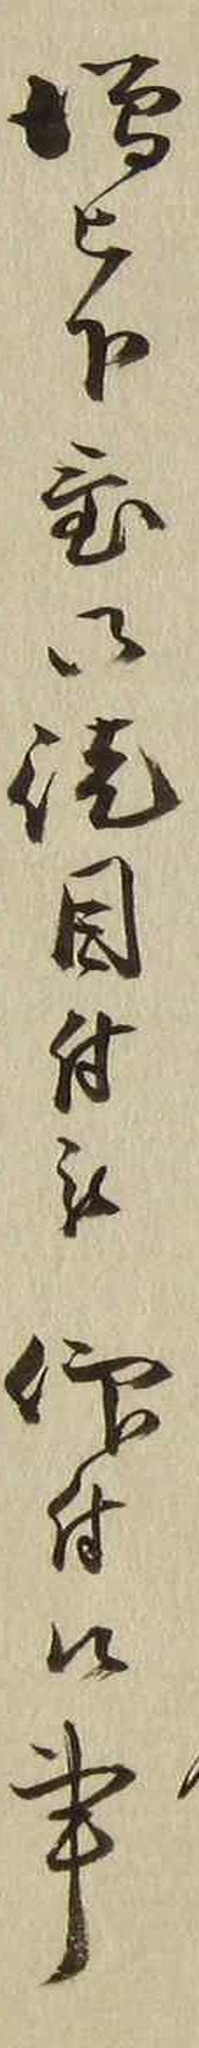増被下置御徒目付被仰付候事
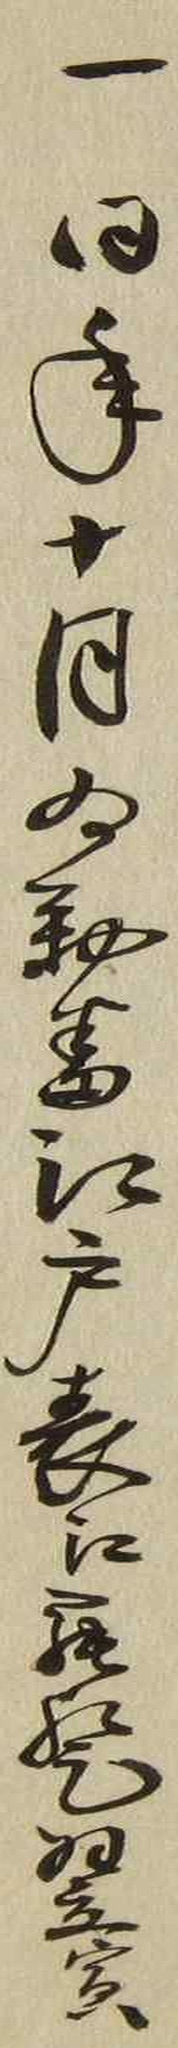一同年十月為勤番江戸表江罷登翌亥
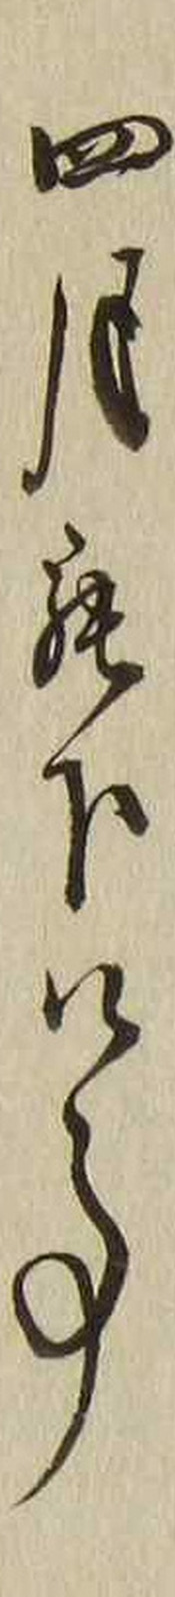四月罷下候事
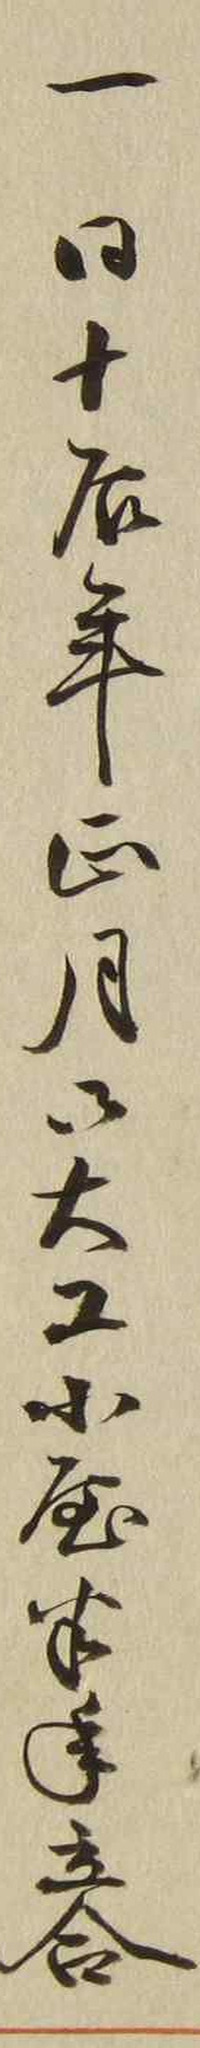一同十辰年正月御大工小屋半年立合

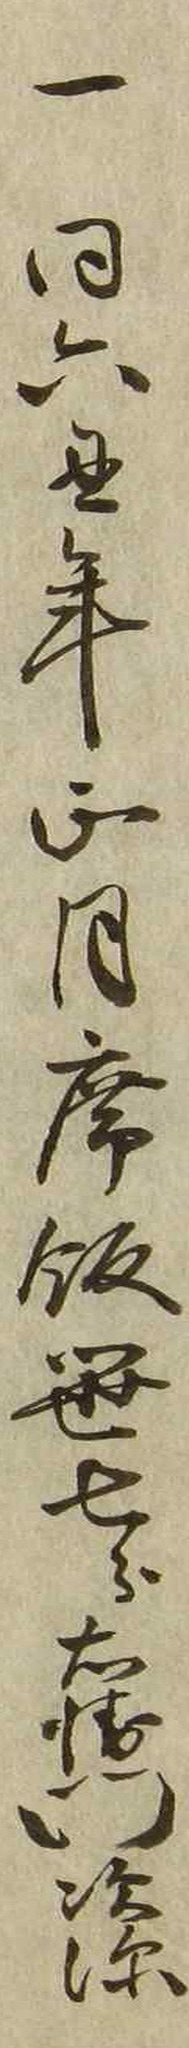一同六丑年正月席飯笹七郎右衛門次深
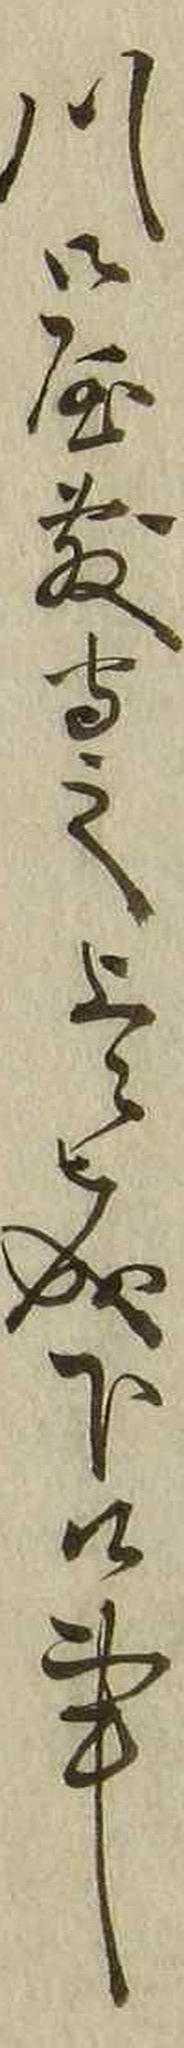川御屋敷守之上ニ被成下候事
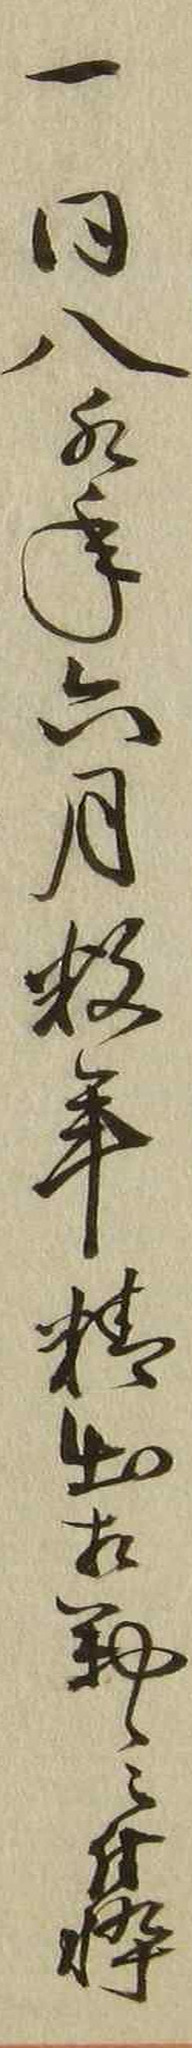一同八卯年六月数年精出相勤候ニ付倅
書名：諸士系譜　巻之65　ち之部1
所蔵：会津若松市立会津図書館
